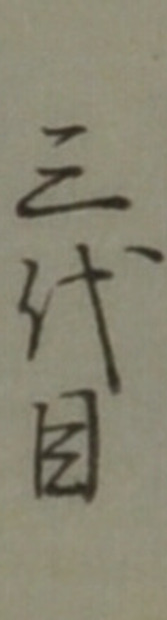三代目
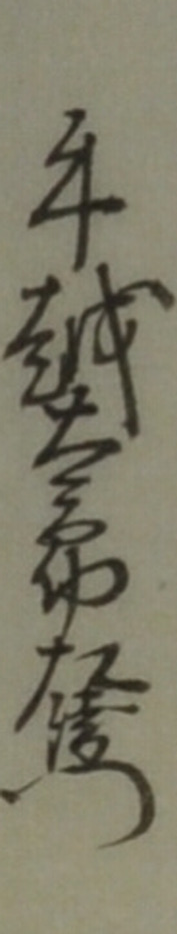牛越太郎左衛門
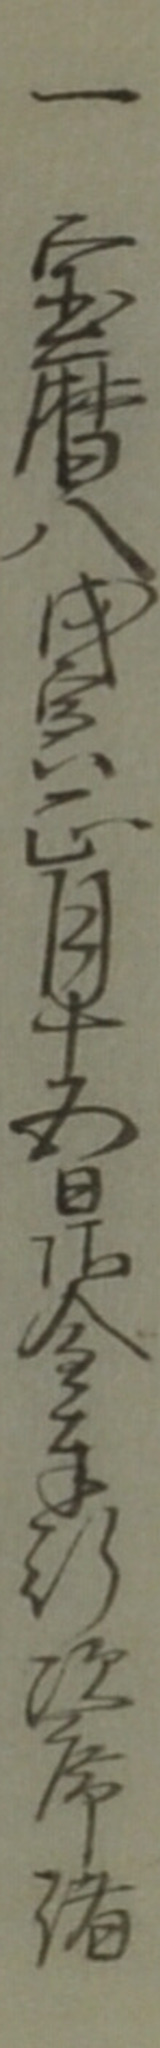一宝暦八戊寅正月十五日御金奉行次席諸
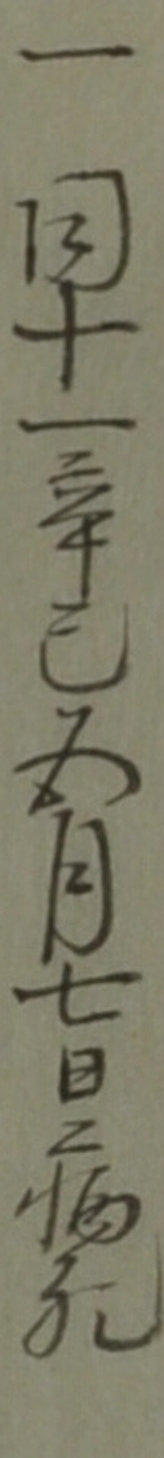一同十一辛巳五月七日病死
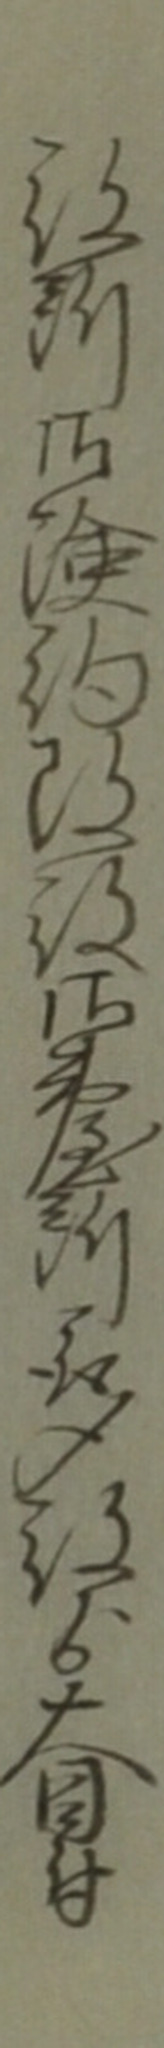役所御倹約改役御台所取〆役ゟ大目付
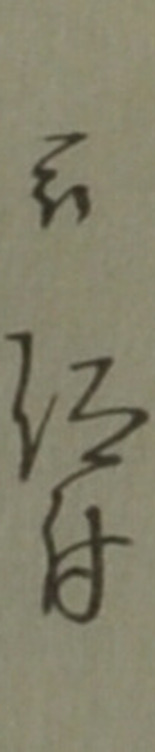被仰付
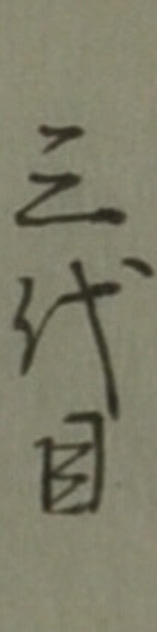三代目
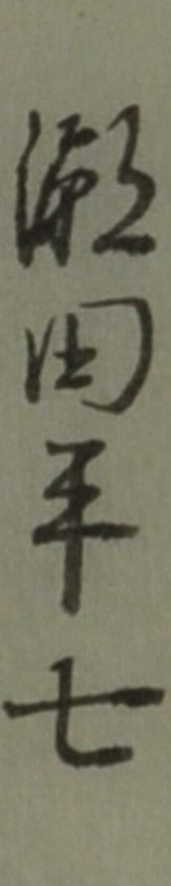瀬田平七
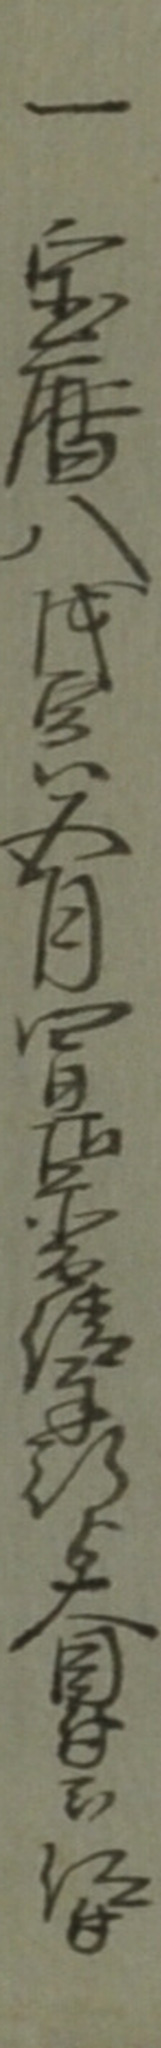一宝暦八戊寅五月四日御普請奉行ゟ大目付被仰付
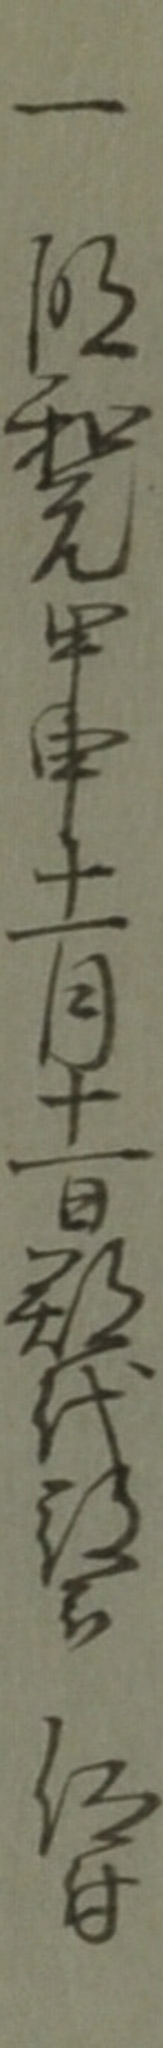一明和元甲申十一月十一日郡代役被仰付
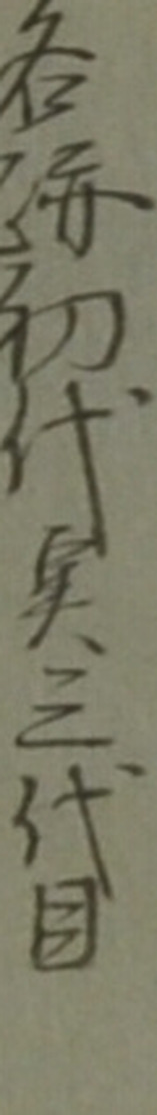名跡初代実三代目
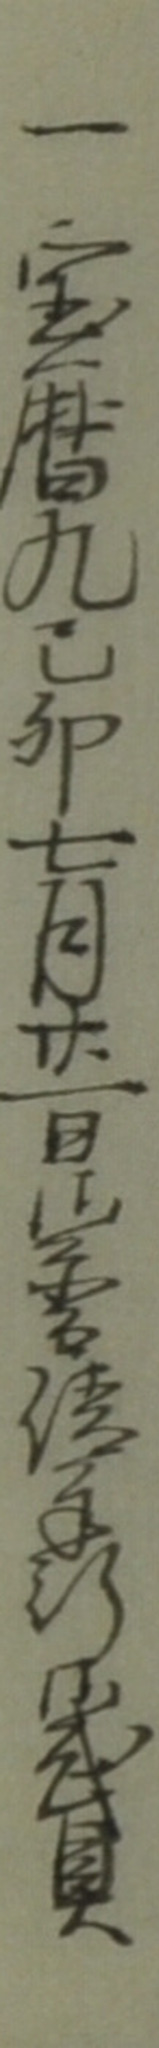一宝暦九己卯七月廿一日御普請奉行御武具
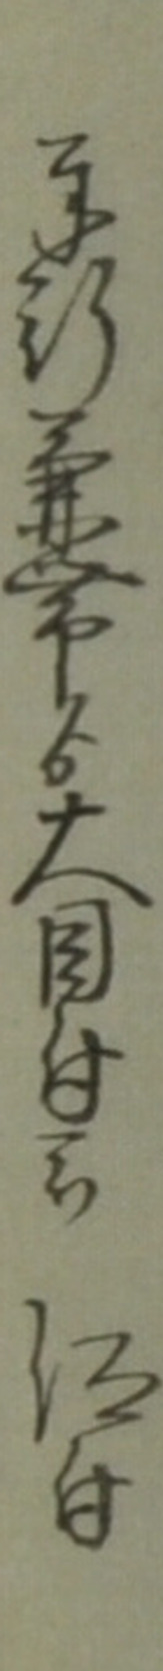奉行兼帯ゟ大目付被仰付
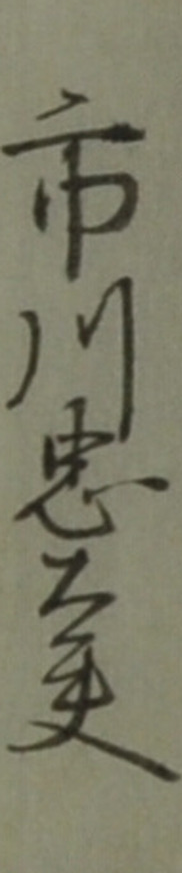市川忠太夫

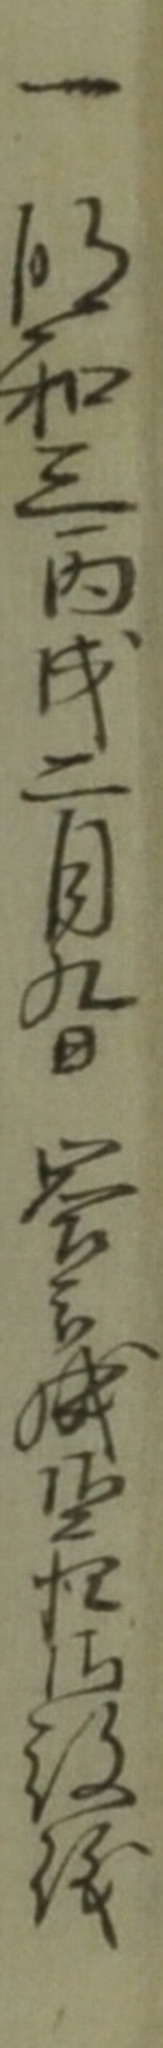一明和三丙戌二月九日思召被成御座御役儀
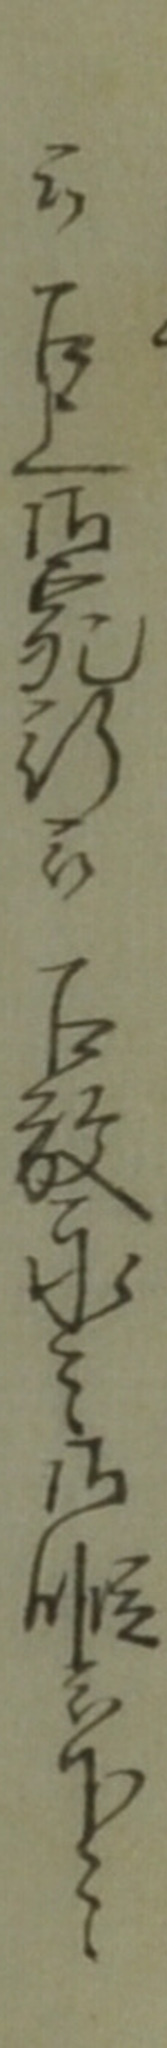被召上御宛行被召放永之御暇被下之
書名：諸御役代々録（三）
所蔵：伊那市立高遠町図書館・合同会社AMANE
